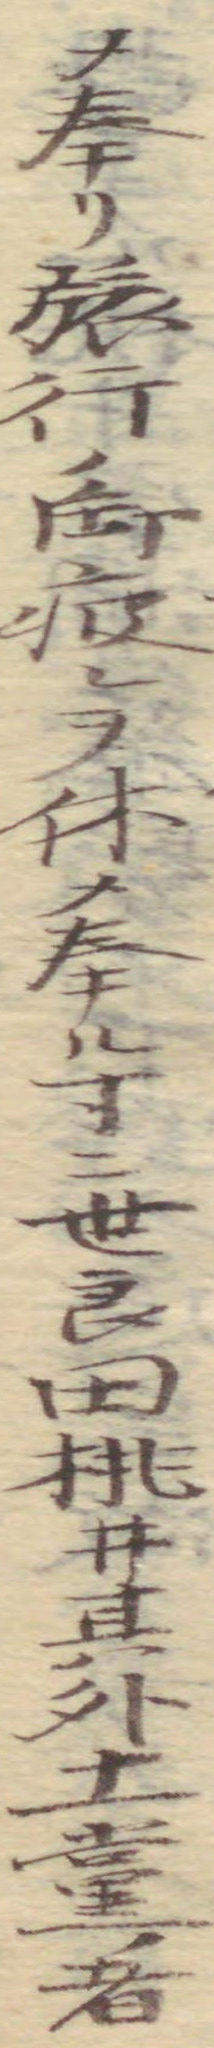メ奉リ旅行御疲シヲ休メ奉ル寸ニ世良田桃井其外十一党ノ者
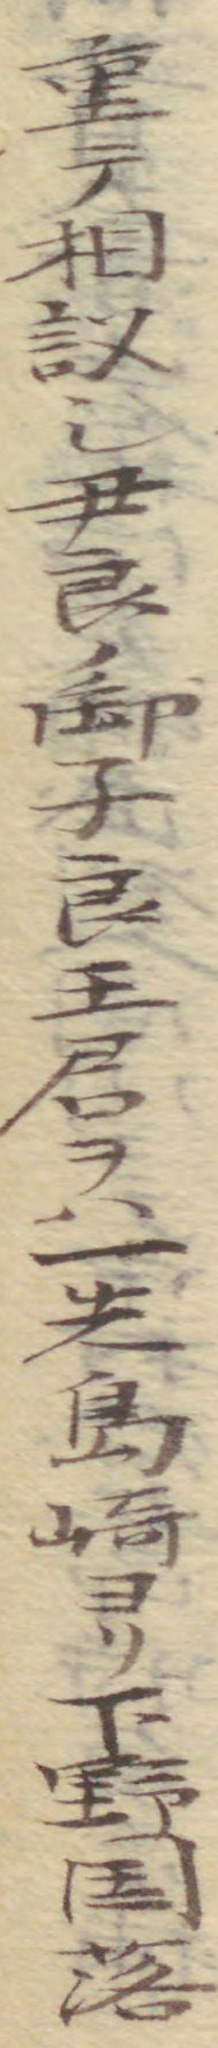重テ相議シ尹良ノ御子良王君ヲハ一先島崎ヨリ下野国落
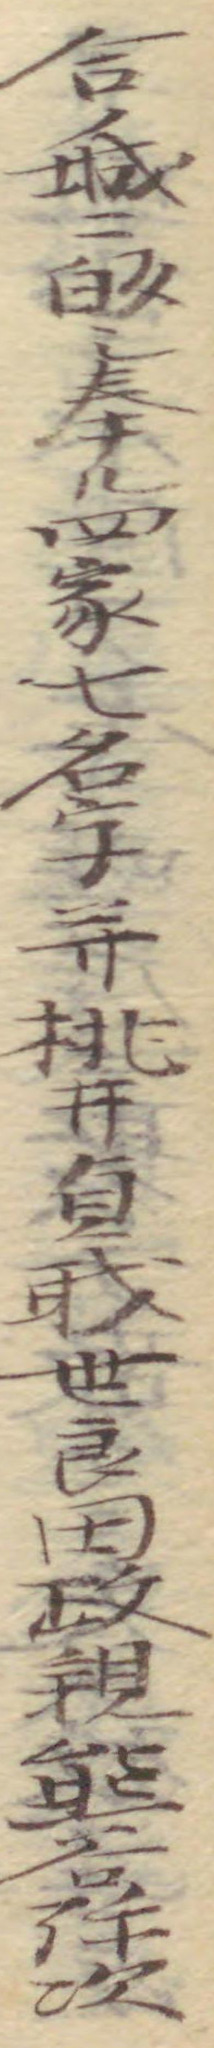合ノ城ニ皈シ奉ル四家七名字幷桃井貞職世良田政親熊谷弥次
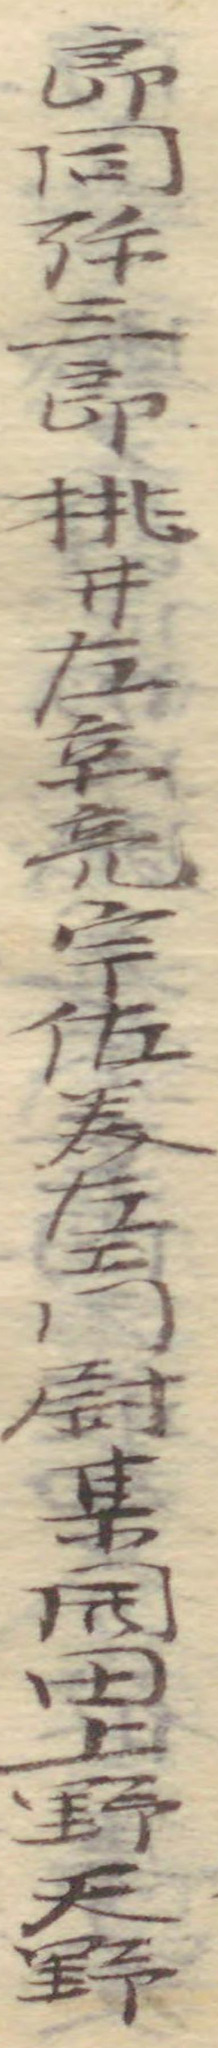郎同弥三郎桃井左京亮宇佐美左エ門尉某開田上野天野
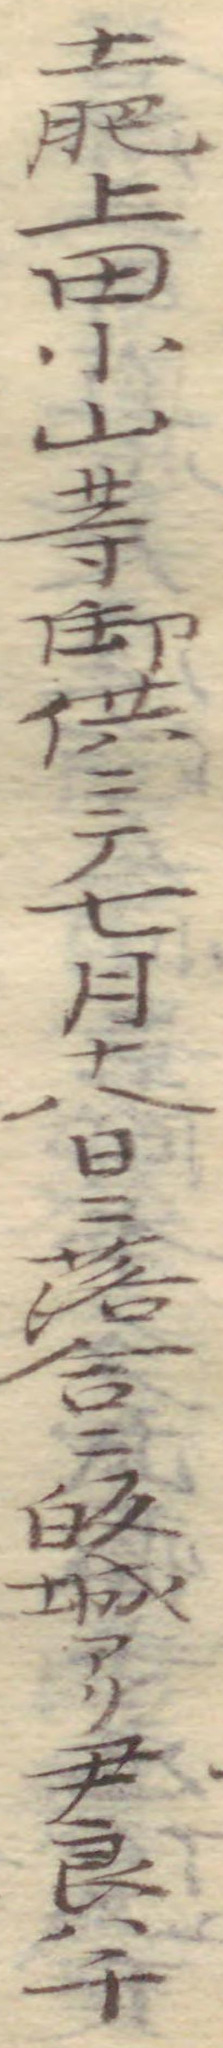土肥上田小山等御供ニテ七月十八日ニ落合ニ皈城アリ尹良ハ千
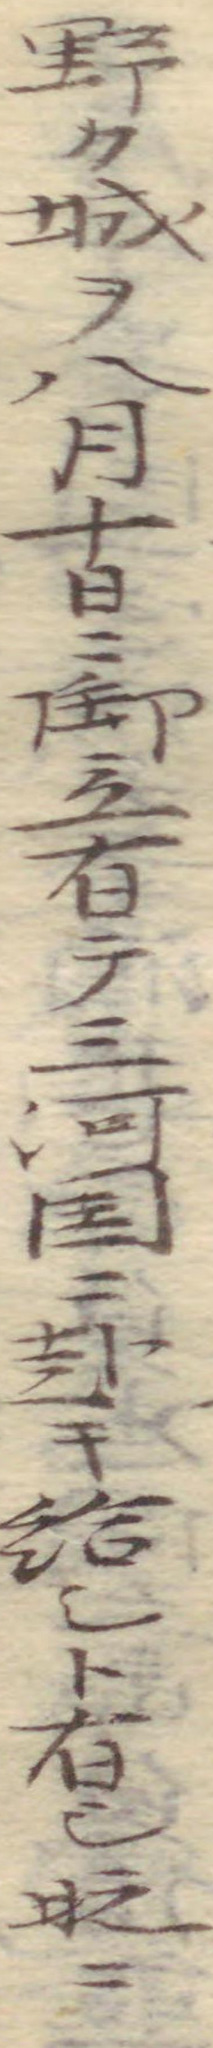野カ城ヲ八月十日ニ御立有テ三河国ニ赴キ給シト有シ𣆅ニ
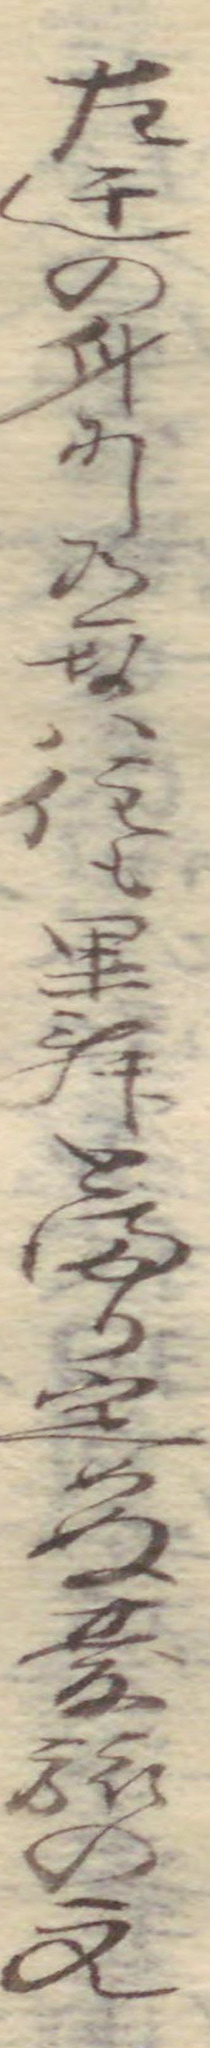左迂の身にし有なハ住も果むとまり定めぬ憂旅の空
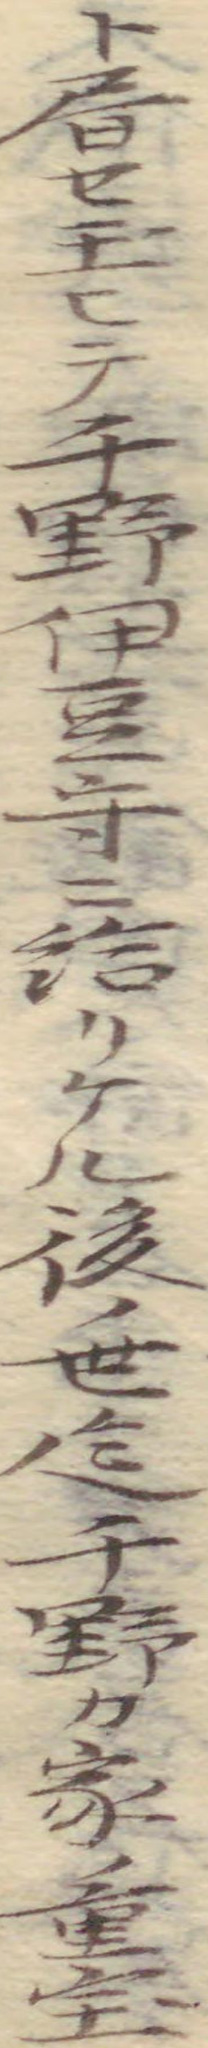ト書セ玉ヒテ千野伊豆守ニ給リケル後ノ世迄千野カ家ノ重宝
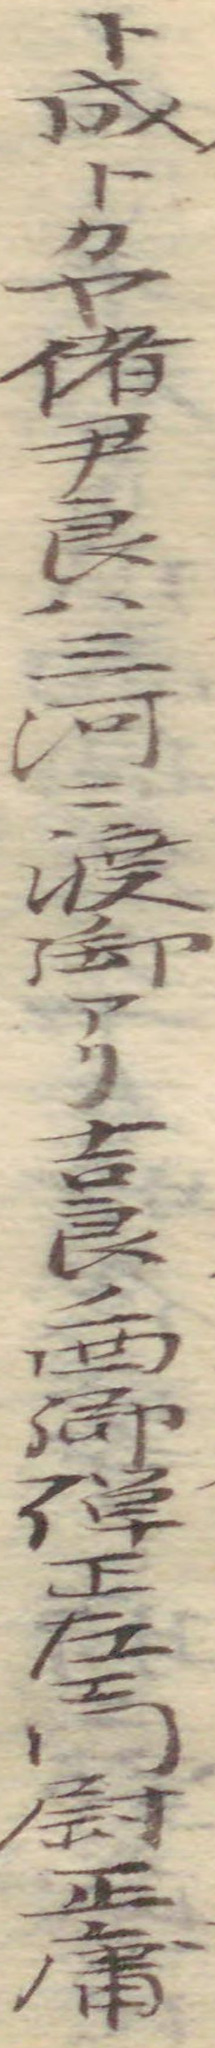ト成トカヤ偖尹良ハ三河ニ渡御アリ吉良ノ西郷弾正左エ門尉正庸
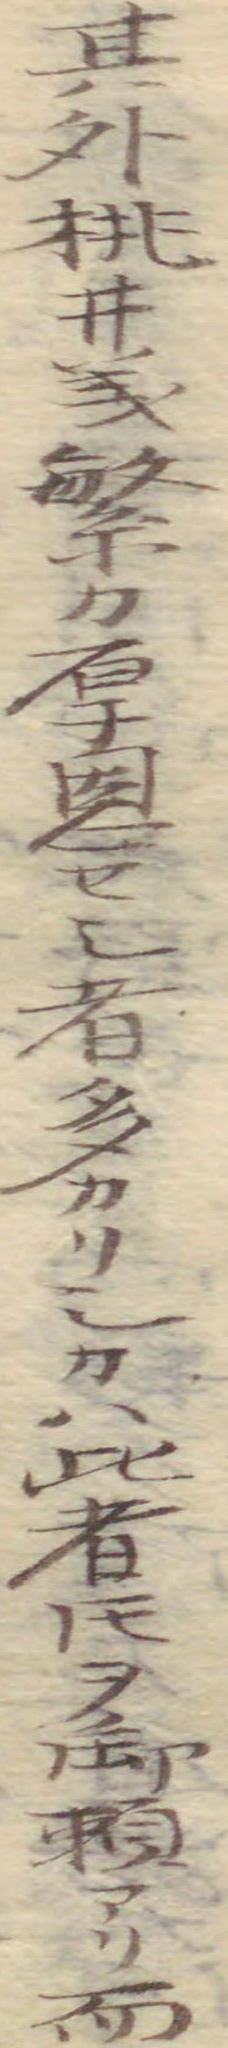其外挑井義繁カ厚恩セシ者多カリシカハ此者トモヲ御頼アリ而
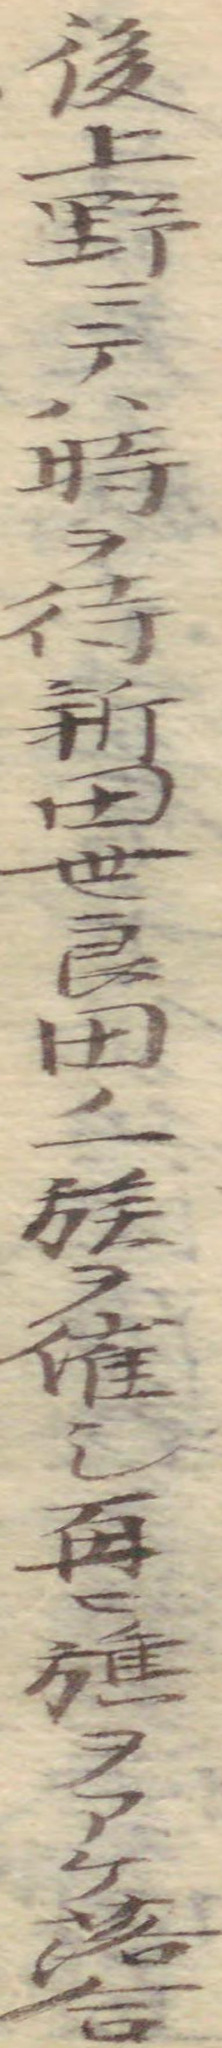後上野ニテハ時ヲ待新田世良田ノ一族ヲ催シ再ヒ旗ヲアケ落合
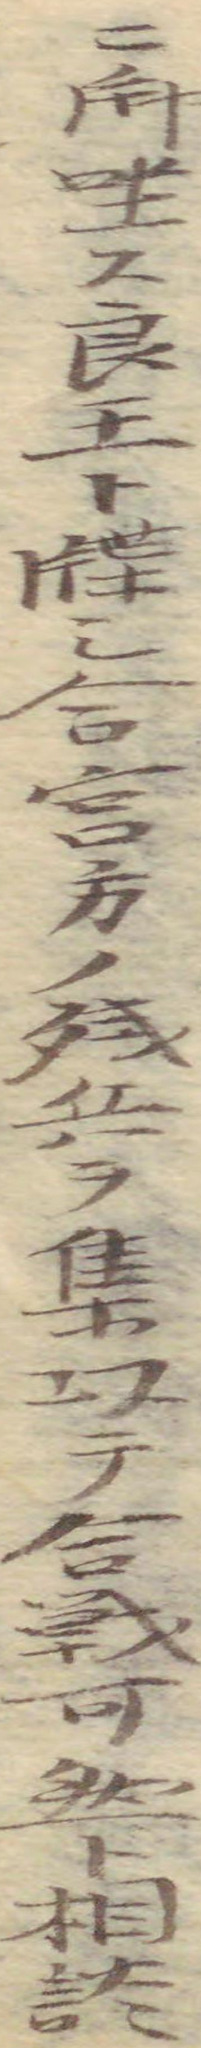ニ御坐ス良王ト牒シ合宮方ノ残兵ヲ集以テ合戦可然ト相談
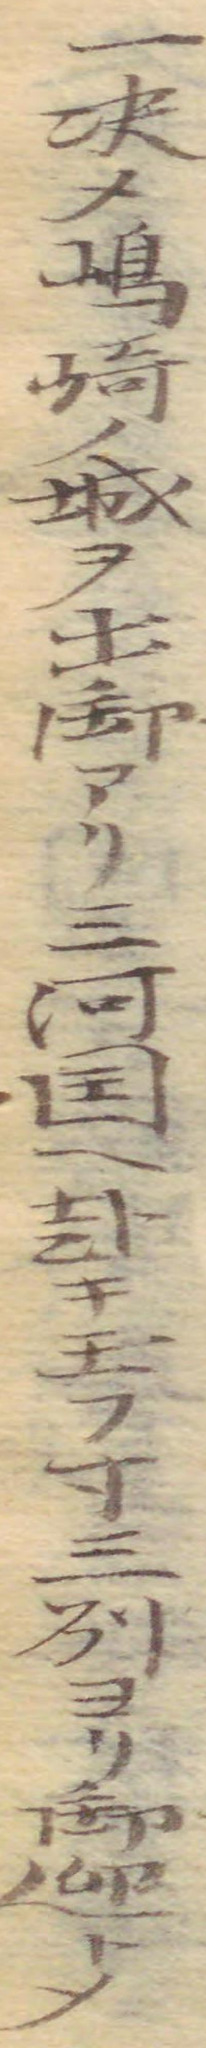一決シテ嶋崎ノ城ヲ出御アリ三河国ヘ赴キ玉フ寸三州ヨリ御迎トシテ

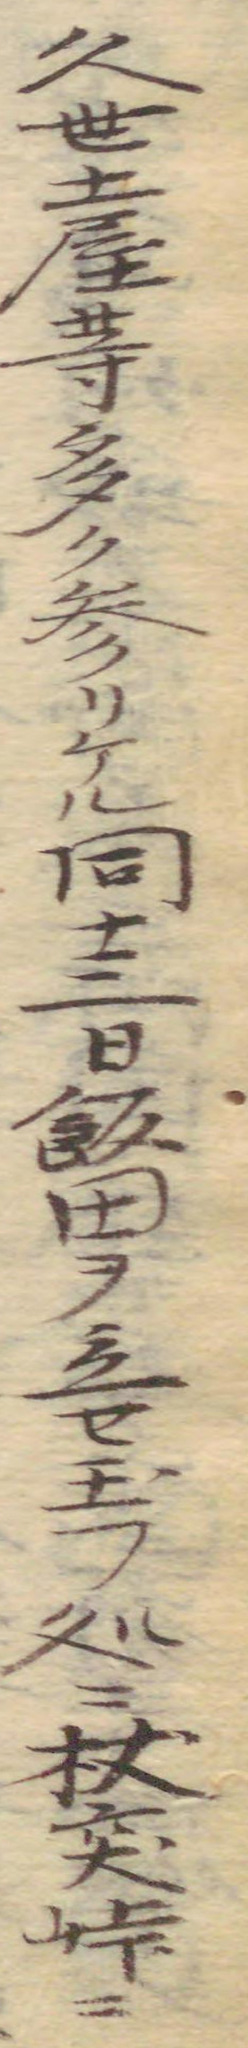久世土屋等多ク参リケル同十三日飯田ヲ立セ玉フ処ニ杖突峠ニ
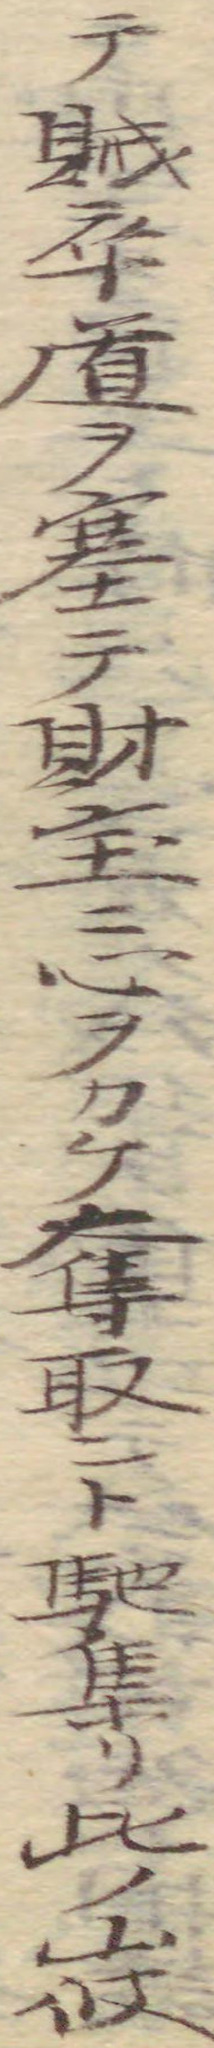テ賊卒道ヲ塞テ財宝ニ心ヲカケ奪取ント馳集リ此ノ山彼
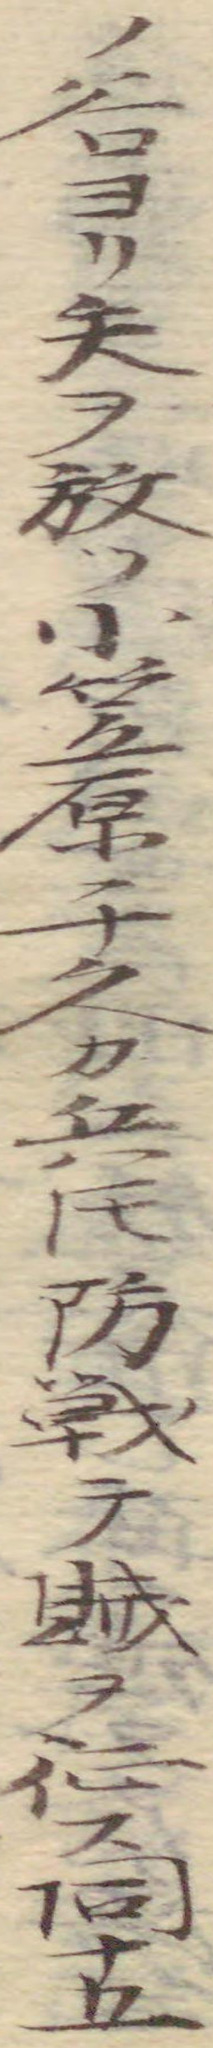ノ谷ヨリ矢ヲ放ツ小笠原千久カ兵トモ防戦テ賊ヲ征ス同十五
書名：鶯宿雑記. 巻199-200
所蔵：国立国会図書館 National Diet Library, JAPAN
